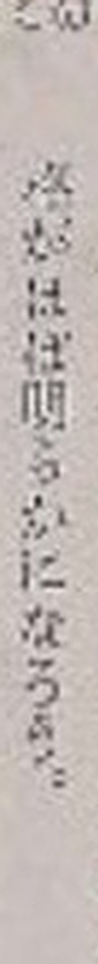格がほぼ明らかになろう。
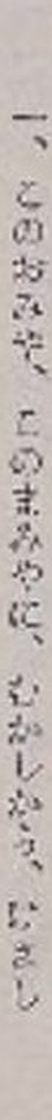一、このおみや、このまみやに、むかしから、けさし
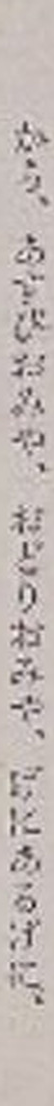から、あすびおみや、おどりおみや、げにあるげに、
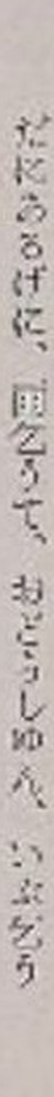だにあるげに、雨乞うて、おどらしゆん、いぶ乞う
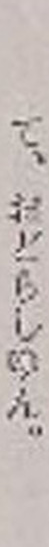て、おどらしゆん。
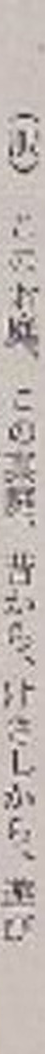(訳)このお庭、この真庭、昔から、けさしから、遊び
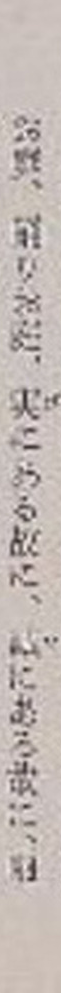お庭、踊りお庭、実にある故に、にある故に、雨
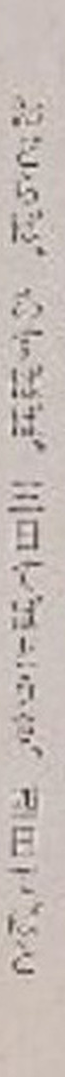おどらば、あすはば、三日てばとうさ、四日てばと
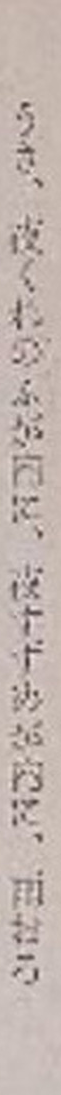うさ、夜くれのふが内に、夜すずめが内に、雨おろ
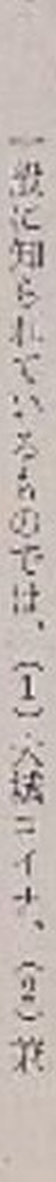一般に知られているものでは、(１)大城コイナ、(２)兼
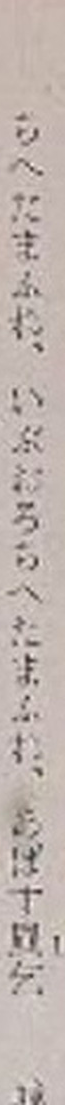ちへたまふれ、いぶおろちへたまふれ、あばす風乞
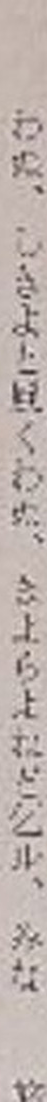わぬ、しきよと風くわぬ、きよらよねど乞れ、みな
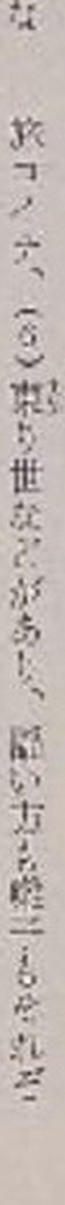旅コイナ、(６)東り世などがあり、謡い方も囃子もそれぞ
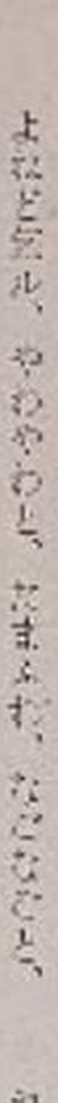よねど乞れ、やわやわと、たまふれ、なごなごと、
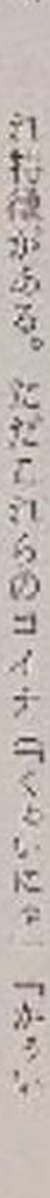れ特徴がある。ただこれらのコイナ(「くゎいにゃ」「かぅい
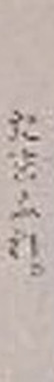たまふれ。
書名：沖縄口承文芸
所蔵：University of the Ryukyus Library
